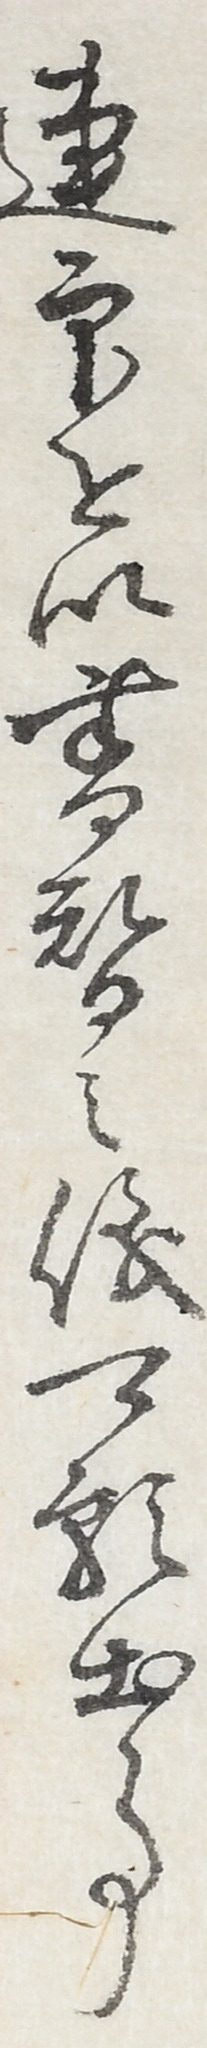連印を以書替之儀可願出事
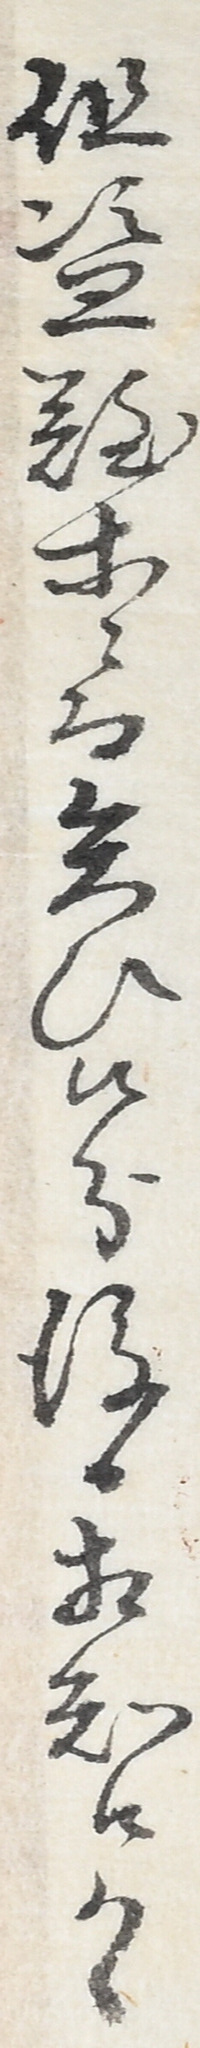但盗難等ニ而失ひ候分後日知候ハゝ

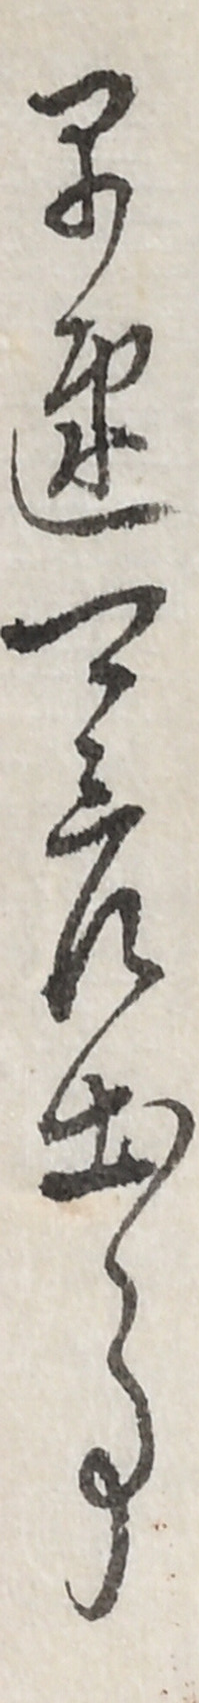早速可差出事
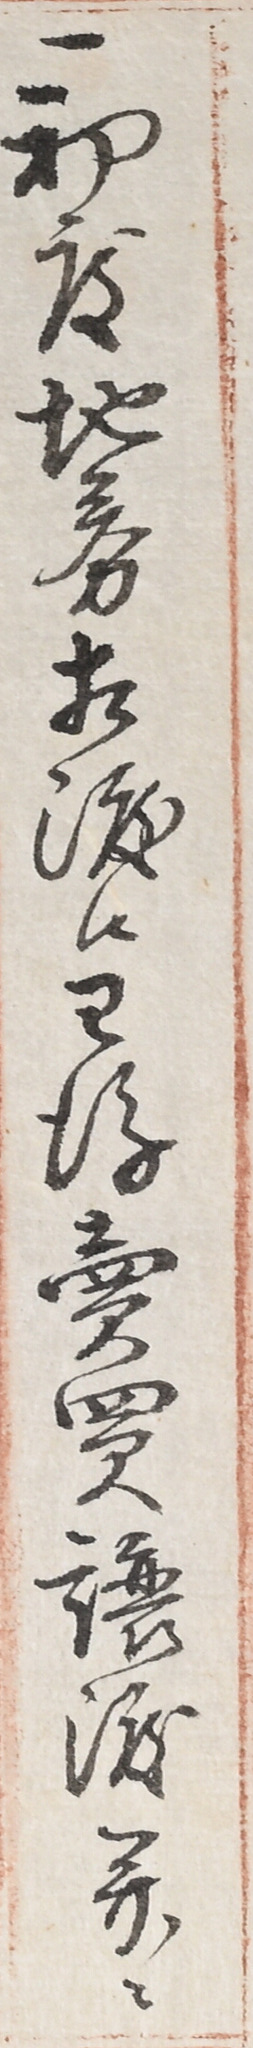一初度地券相渡候已後売買譲渡幷ニ
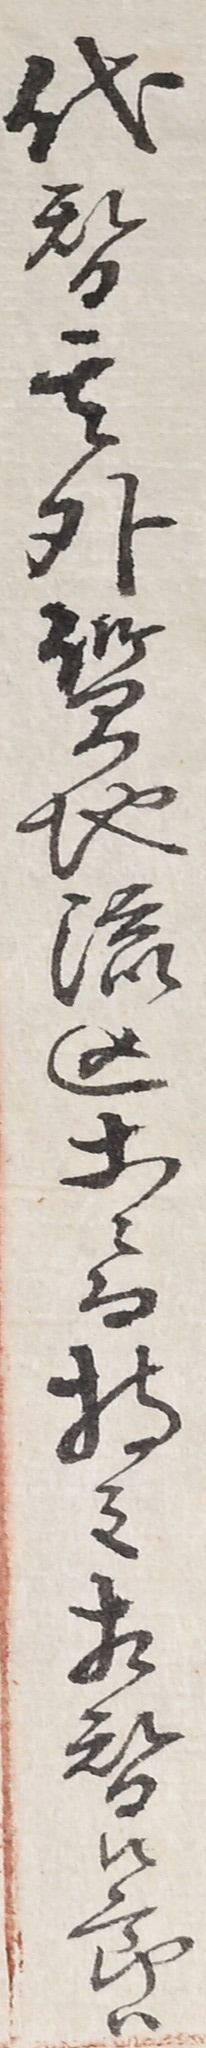代替其外質地流込等ニ而持主相替候節ハ
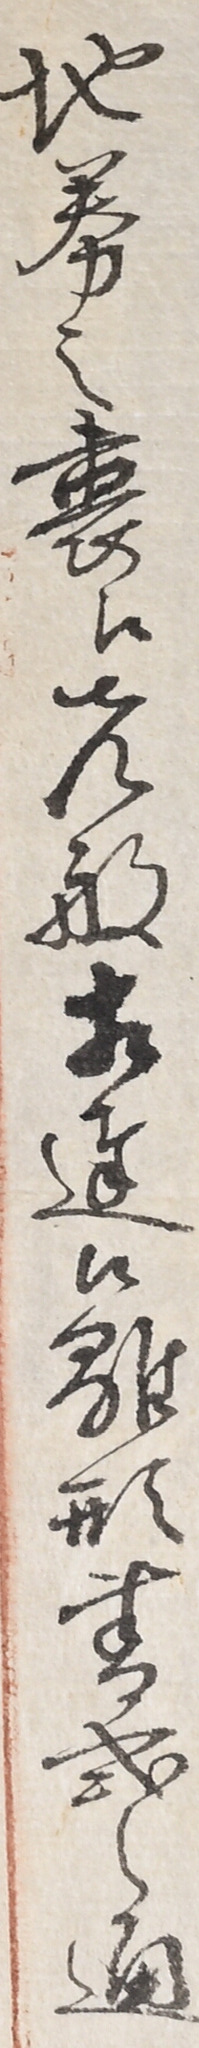地券之裏え先般相達候雛型書式之通
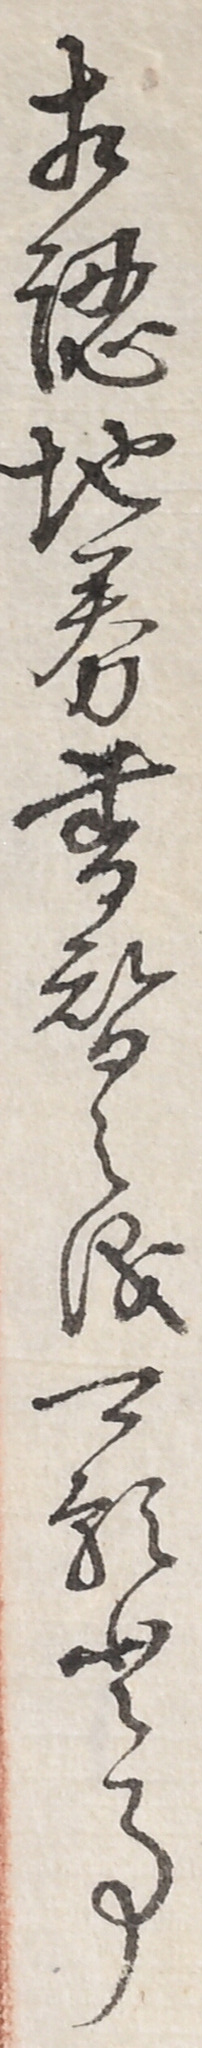相認地券書替之儀可願出事
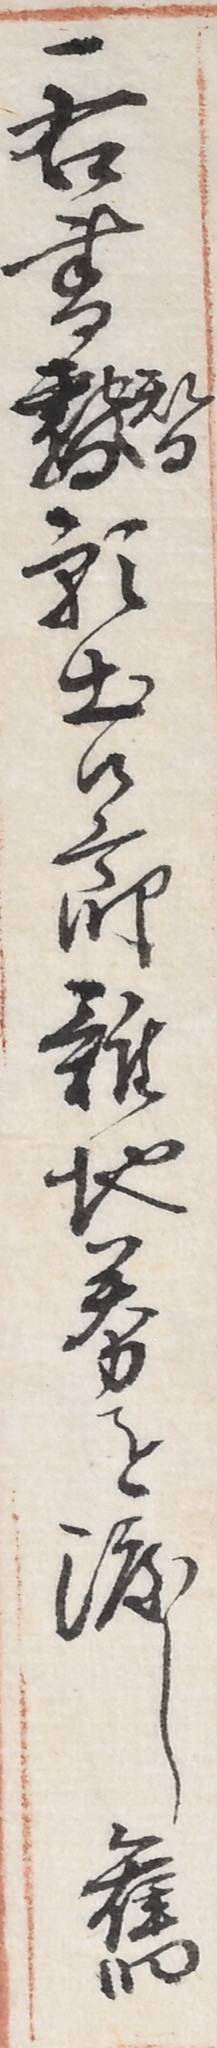一右書替願出候節新地券を渡し旧
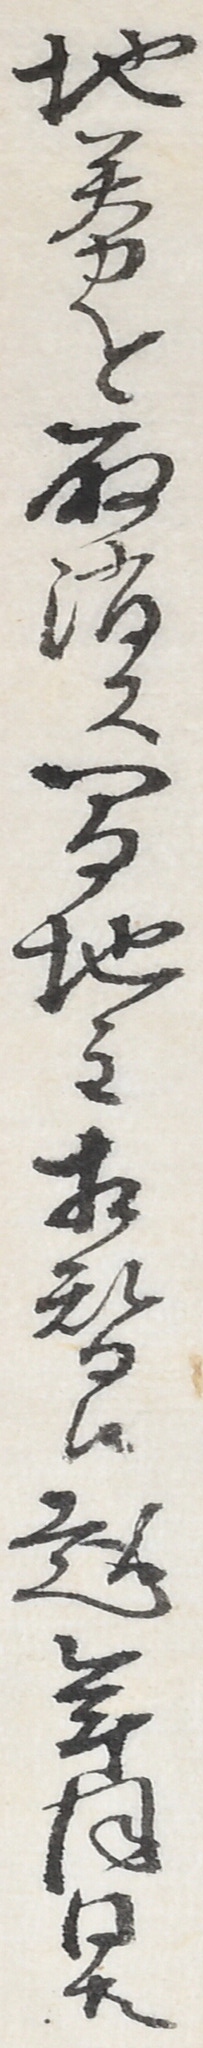地券を取消ス間地主相替候趣年月日共
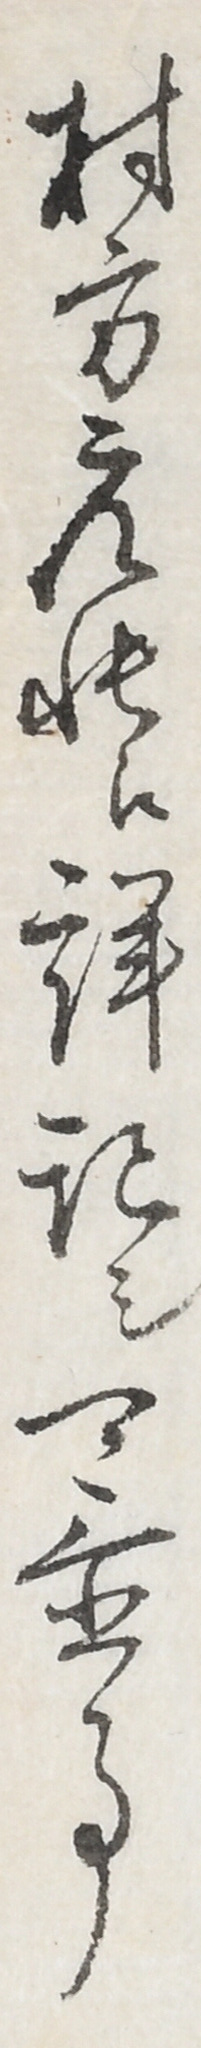村方元帳え詳記シ可置事
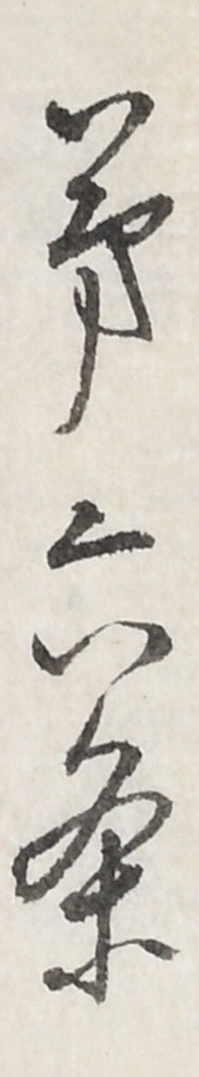第六条
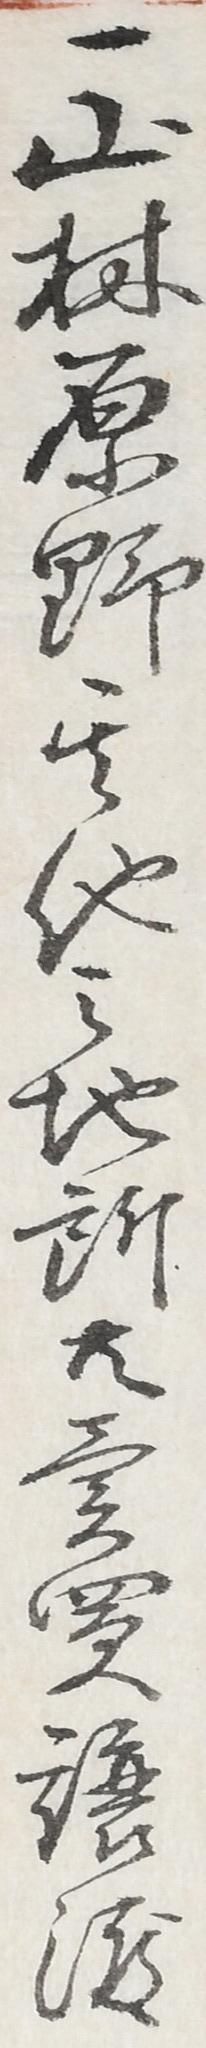一山林原野其他之地所共売買譲渡
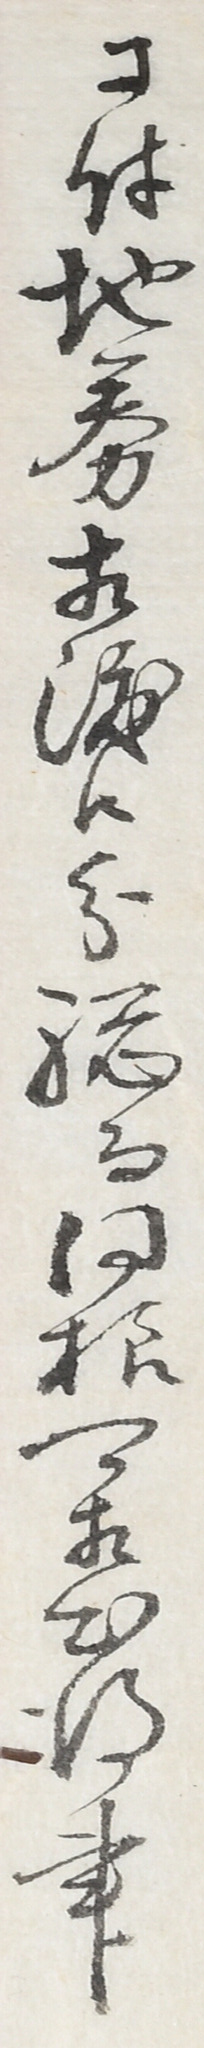に付地券相渡候分総而同様可相心得事
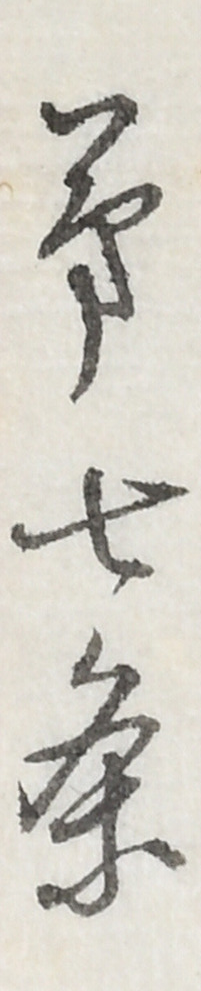第七条
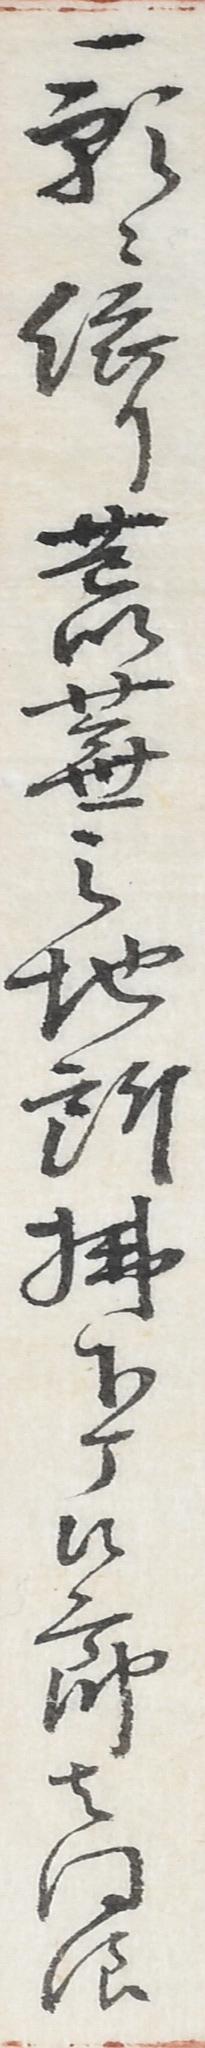一願ニ依り荒蕪之地所払下ケ候節は同様
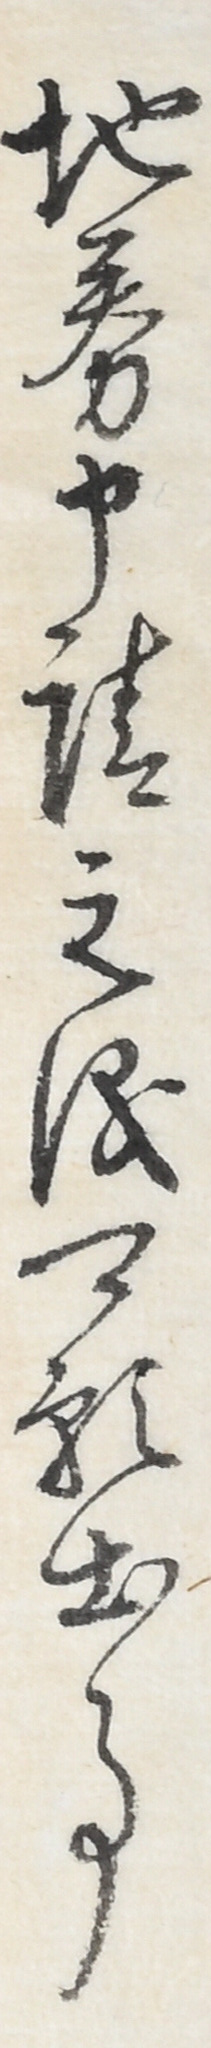地券申請之儀可願出事
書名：壹番・御布告一式
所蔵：伊那市立高遠町図書館・合同会社AMANE
